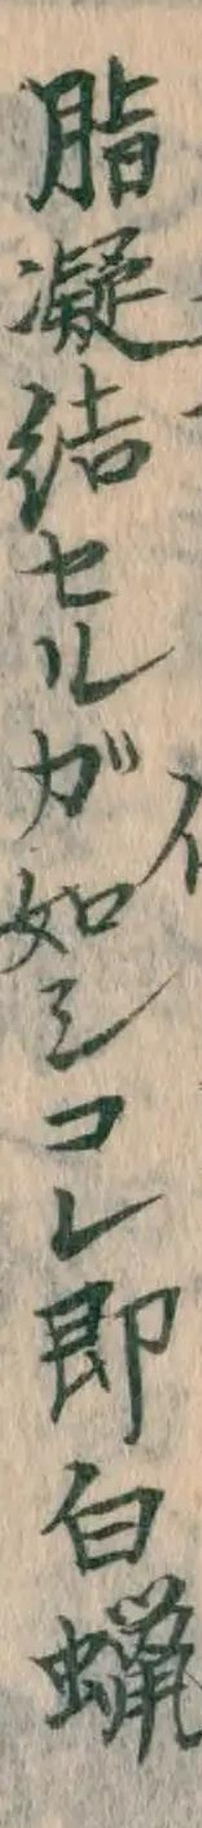脂凝結セルガ如シコレ即白蝋
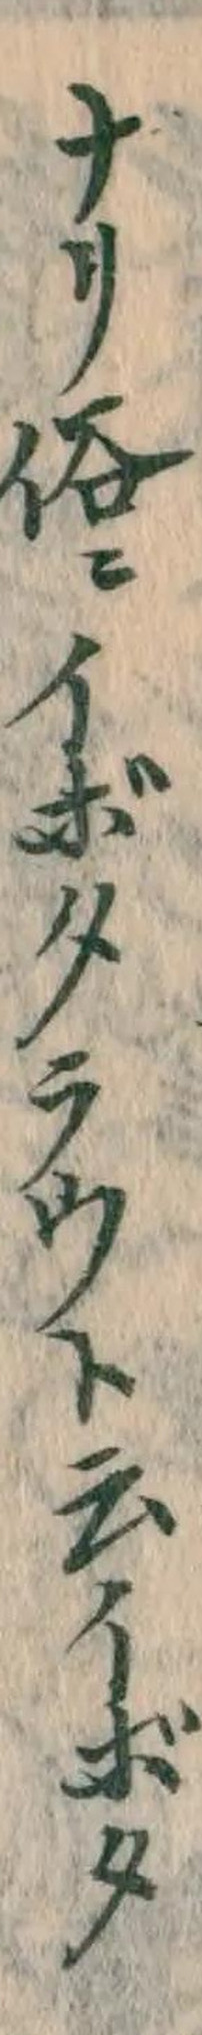ナリ俗ニイボタラウト云イボタ
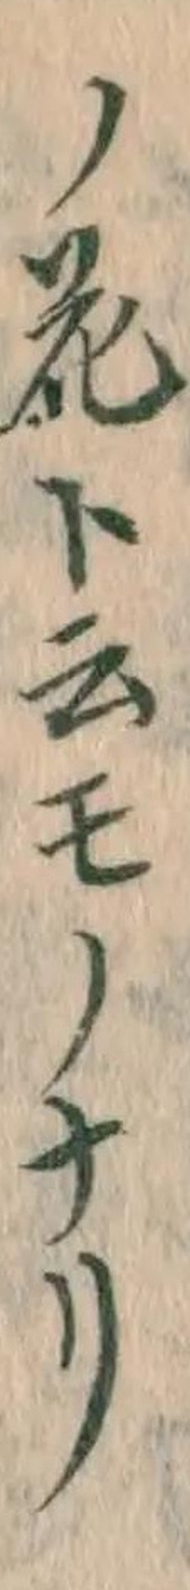ノ花ト云モノナリ

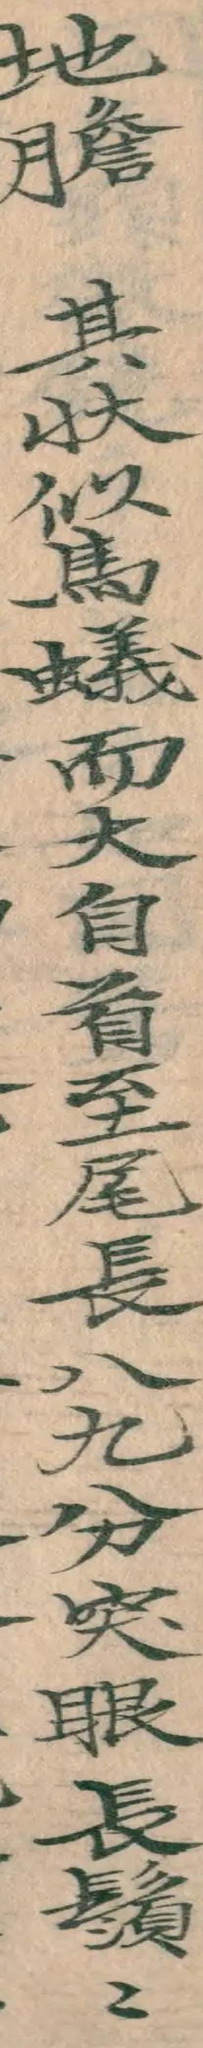地膽其状似馬蟻而大自首至尾長八九分突眼長鬚々
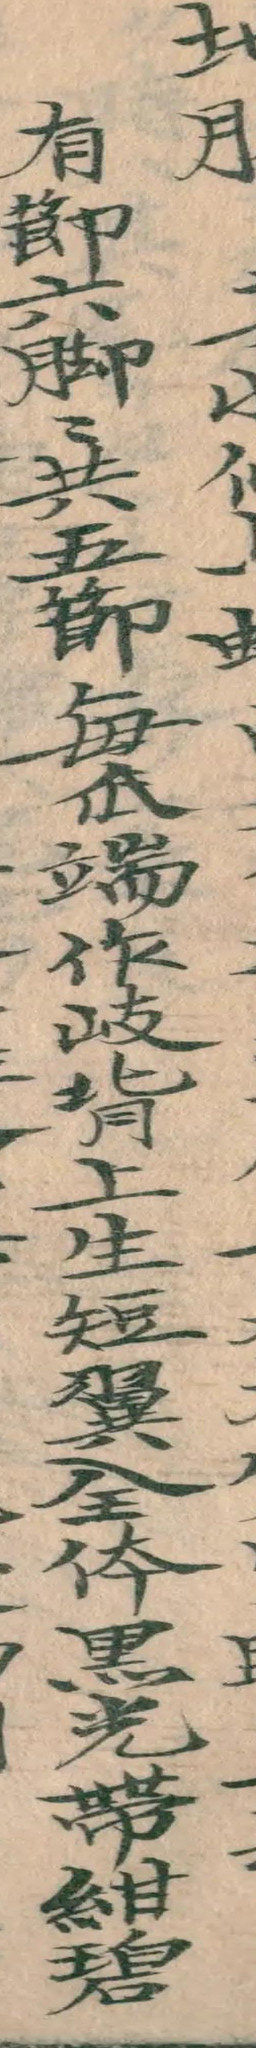有節六脚々共五節毎爪端作岐背上生短翼全体黒光帯紺碧
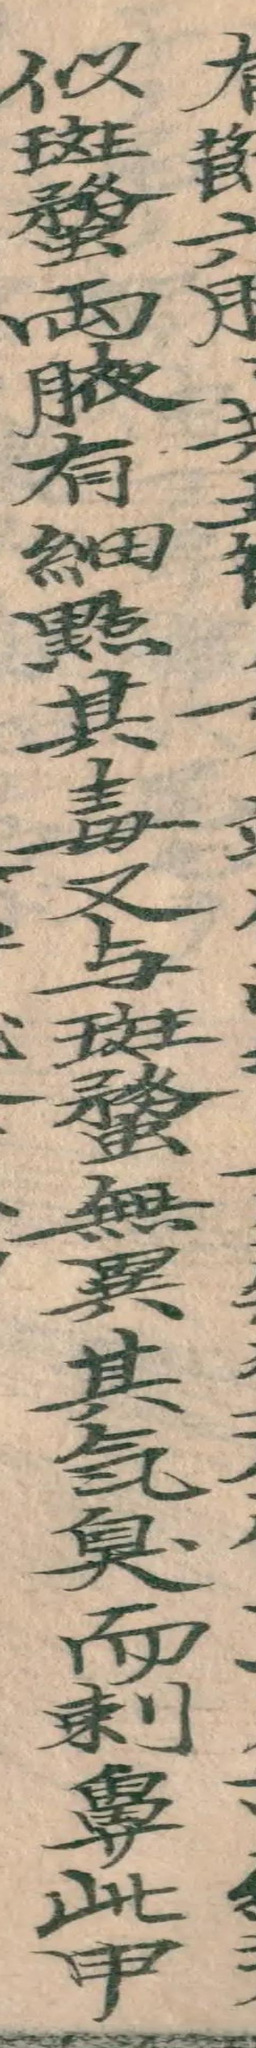似斑𧎻両腋有細點其毒又与斑𧎻螫無異其気臭而刺鼻此甲
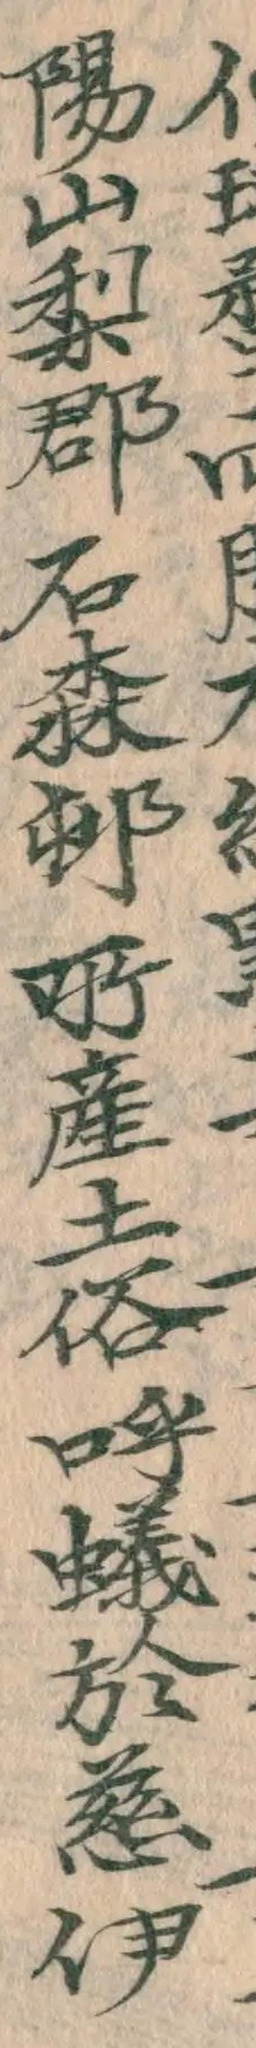陽山梨群石森邨所産土俗呼蟻於慈伊
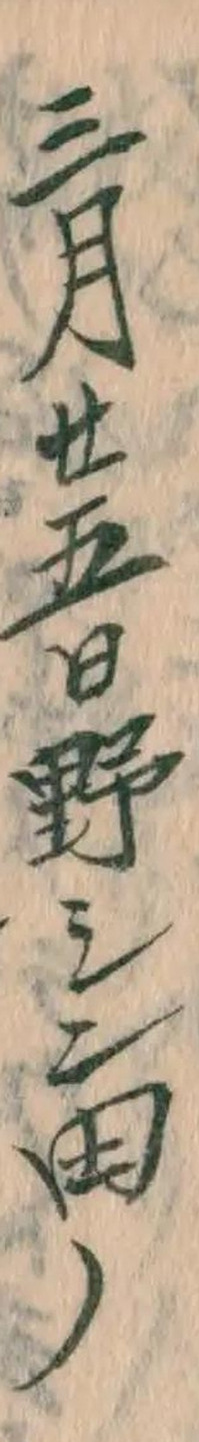三月廿五日野シン田ノ
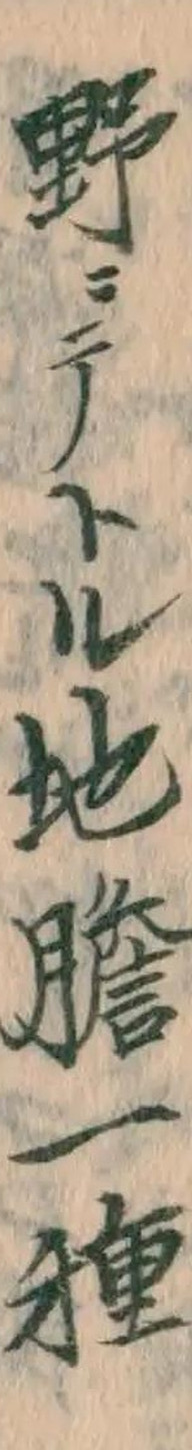野ニテトル地膽一種
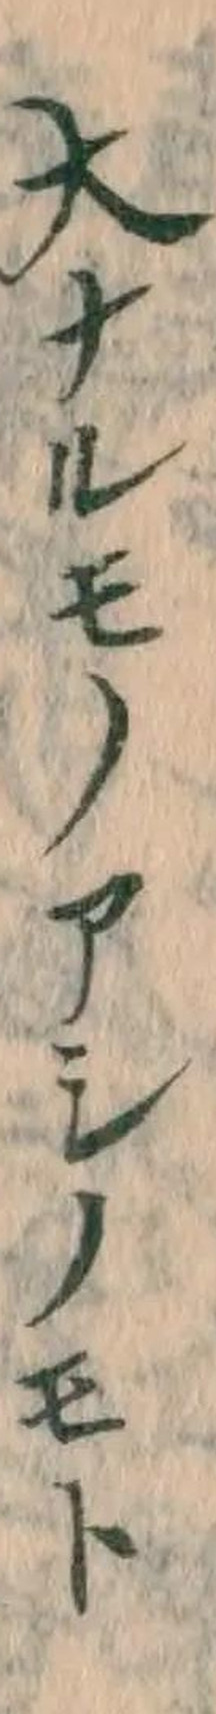大ナルモノアシノモト
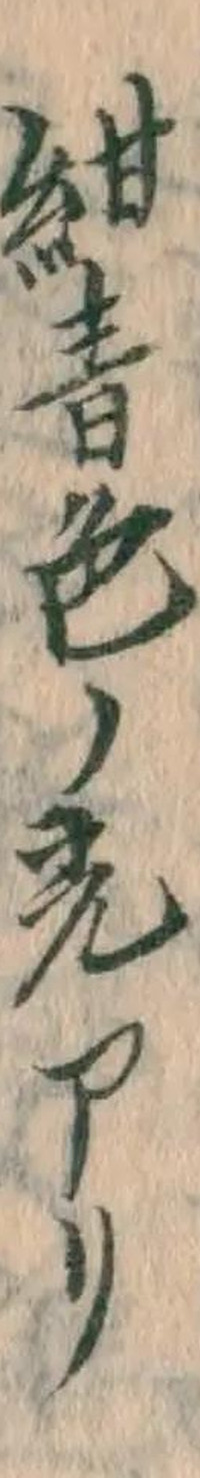紺青色ノ光アリ
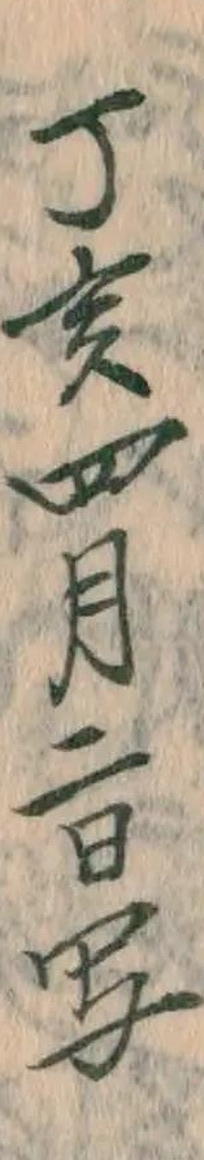丁亥四月二日写
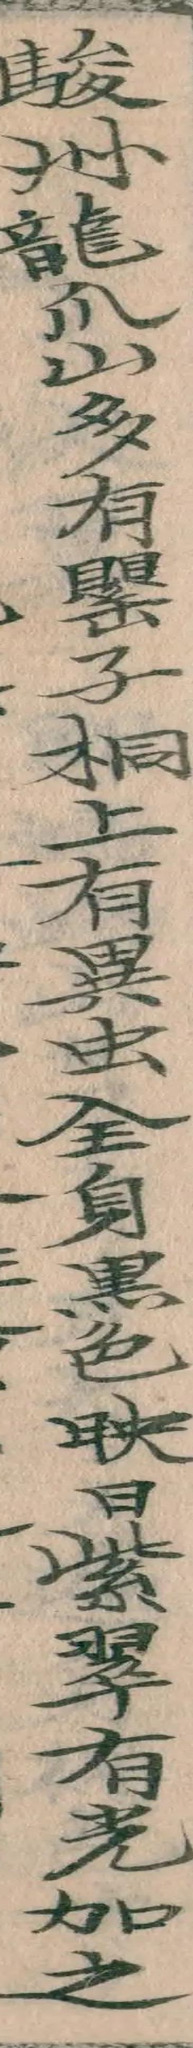駿州龍爪山多有罌子桐上有異虫全身黒色映日紫翠有光加之
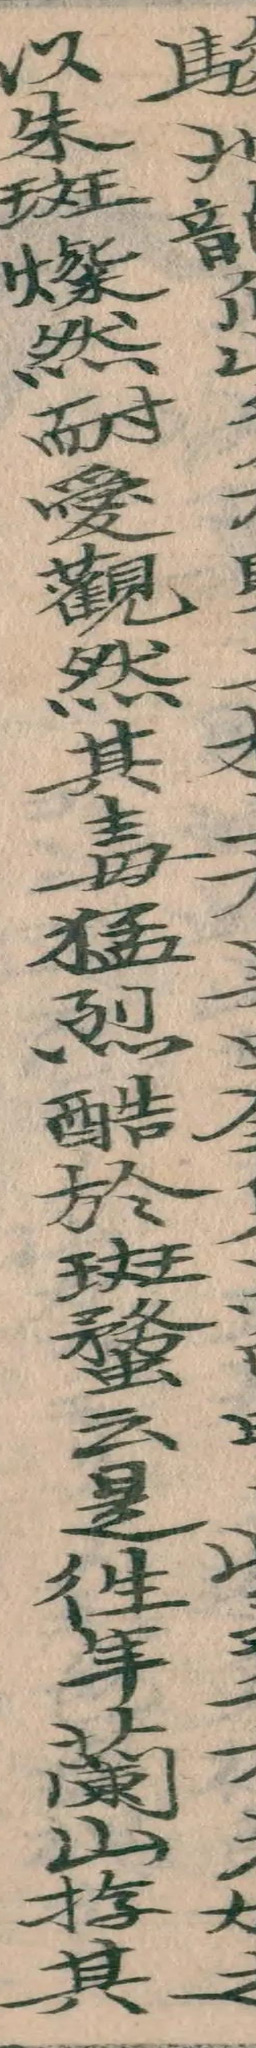以朱斑燦然耐愛観然其毒猛烈酷於斑𧎻云是往年蘭山斿其
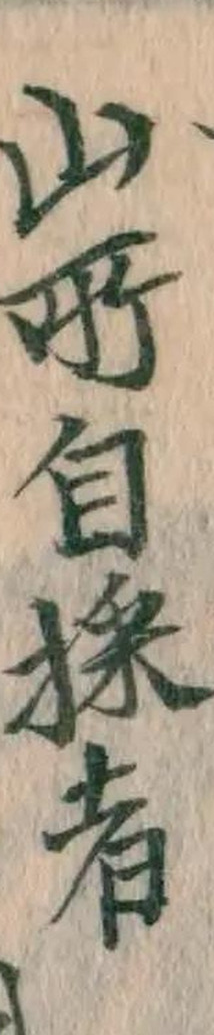山所自採者
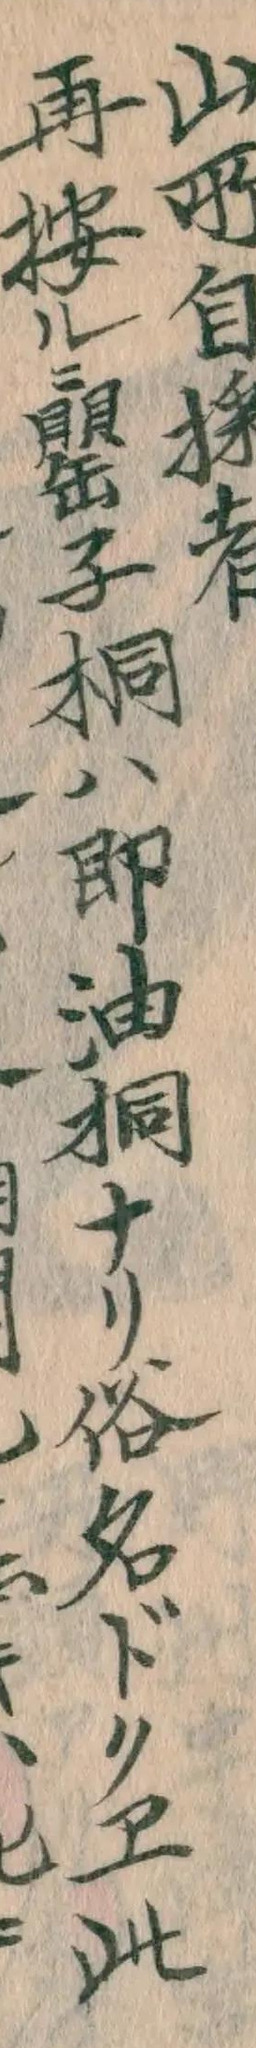再按ルニ罌子桐ハ即油桐ナリ俗名ドクヱ此
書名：千蟲譜 3巻. [3]
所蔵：国立国会図書館 National Diet Library, JAPAN
